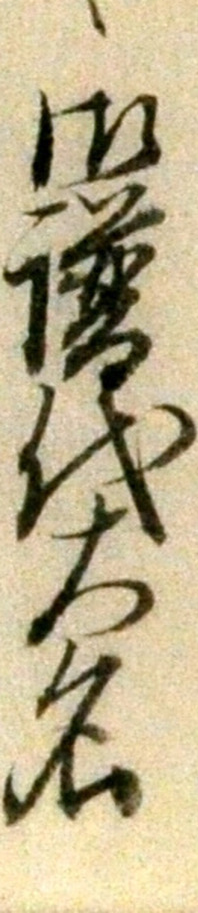御譜代大名
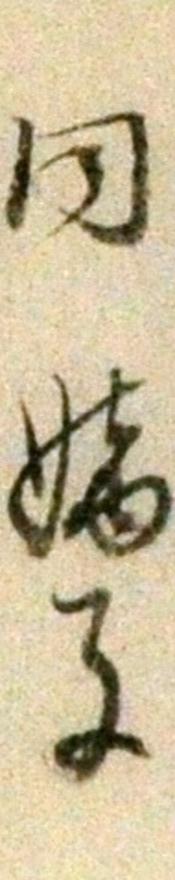同嫡子
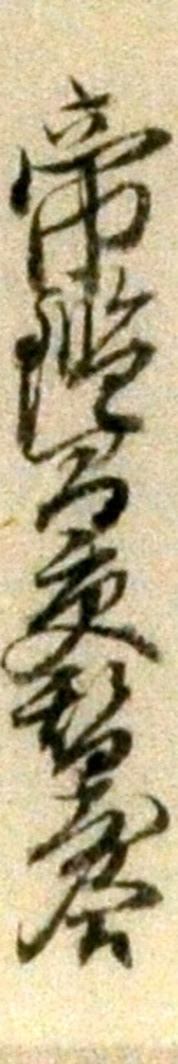帝鑑間交替寄合
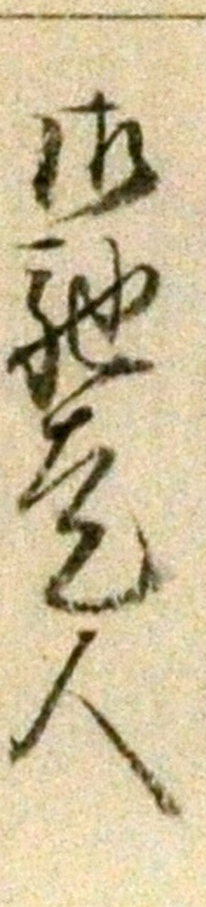御馳走人
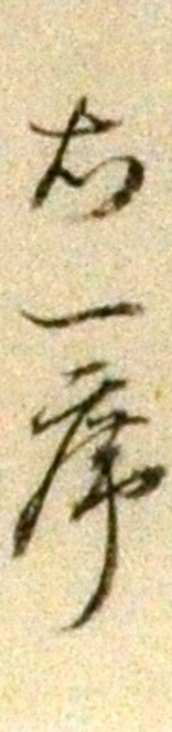右一席
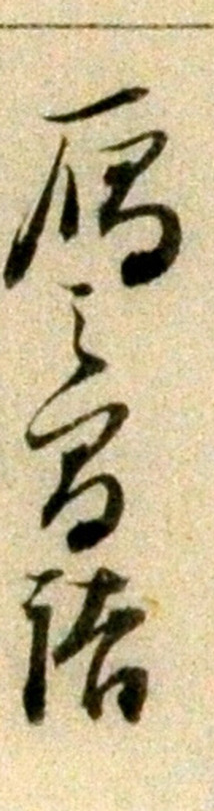雁之間詰
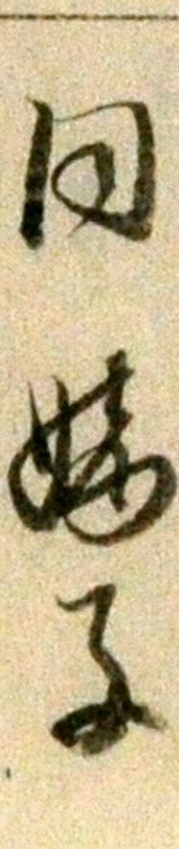同嫡子
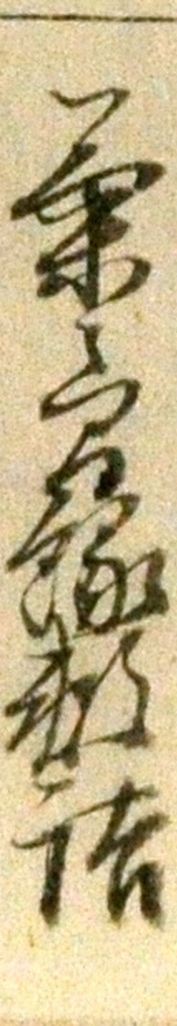菊之間縁頬詰
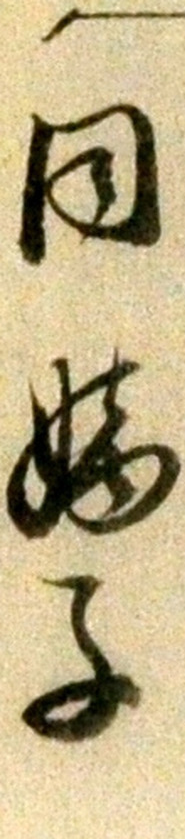同嫡子
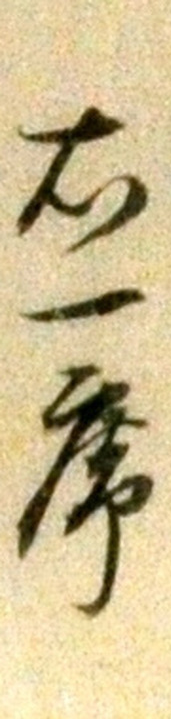右一席
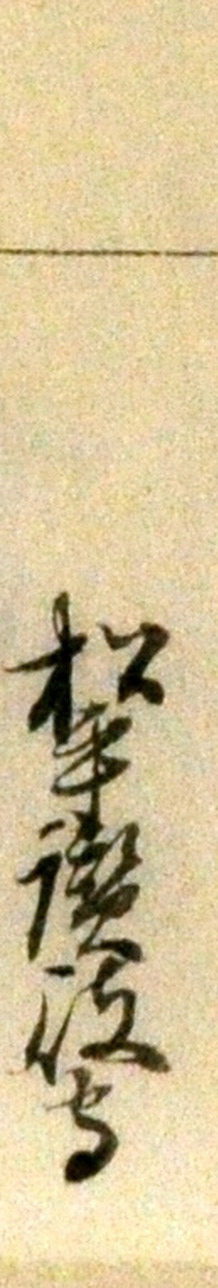松平讃岐守
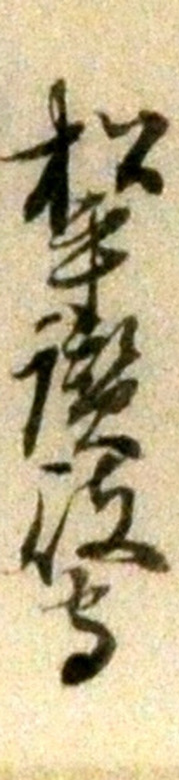松平讃岐守
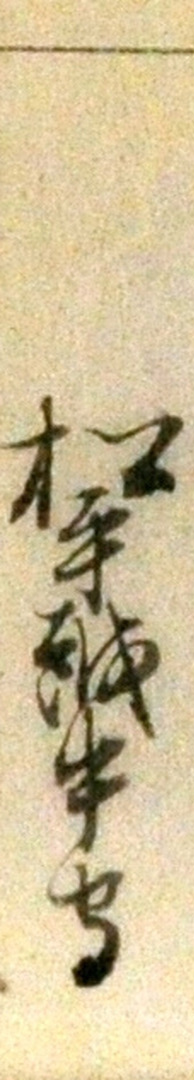松平越中守
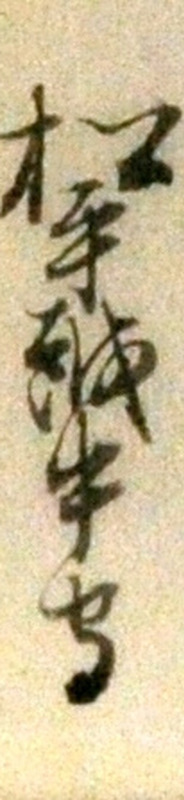松平越中守
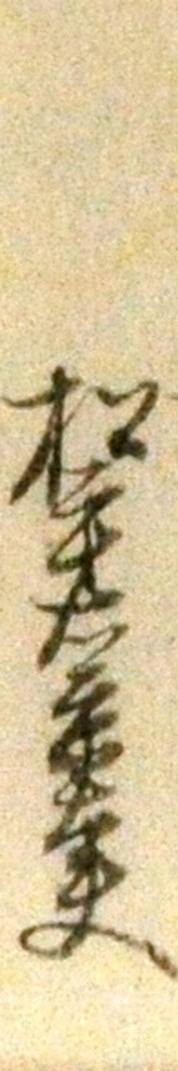松平右京大夫
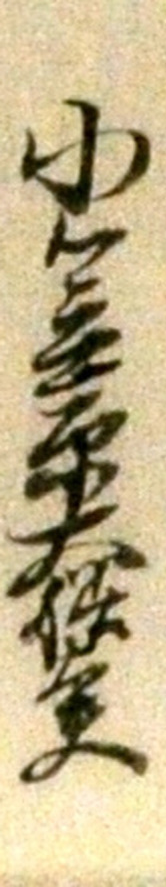小笠原大膳大夫
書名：御馳走御能ノ節ノ留外
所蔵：伊那市立高遠町図書館・合同会社AMANE
